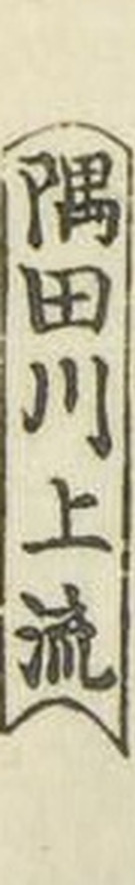隅田川上流
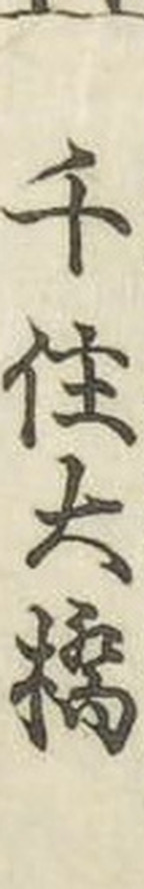千住大橋
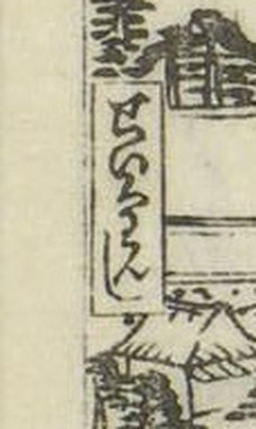せいくわんし

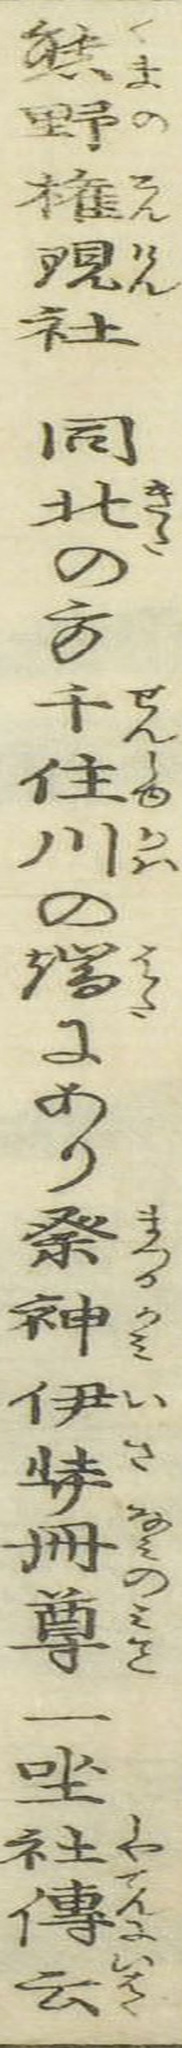熊野権現社同北の方千住川の端にあり祭神伊弉冊尊一坐社伝云
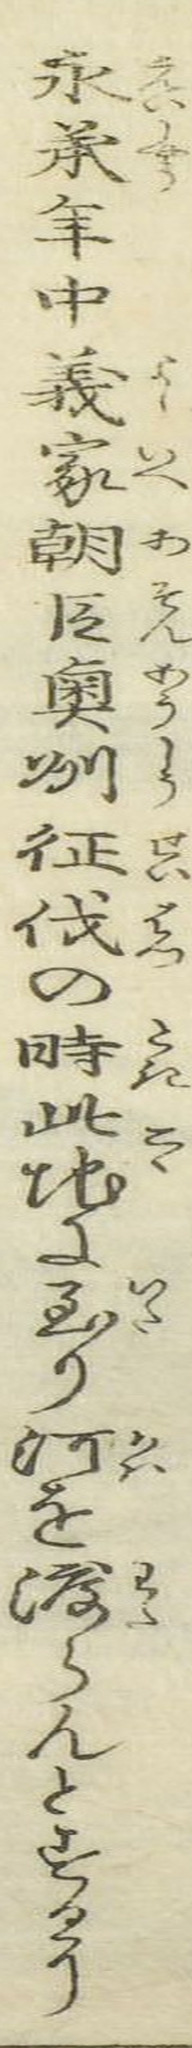永承年中義家朝臣奥州征伐の時此地に至り河を渡らんとするに
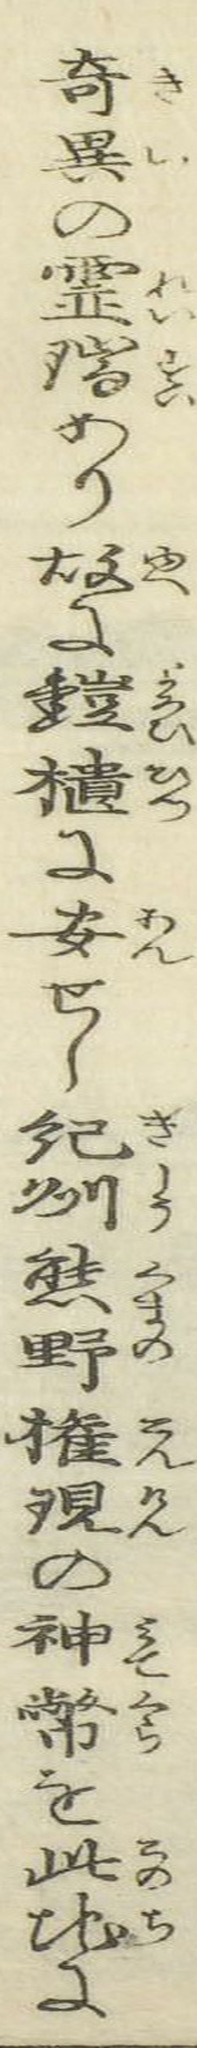奇異の霊瑞あり故に鎧櫃に安せし紀州熊野権現の神幣を此地に
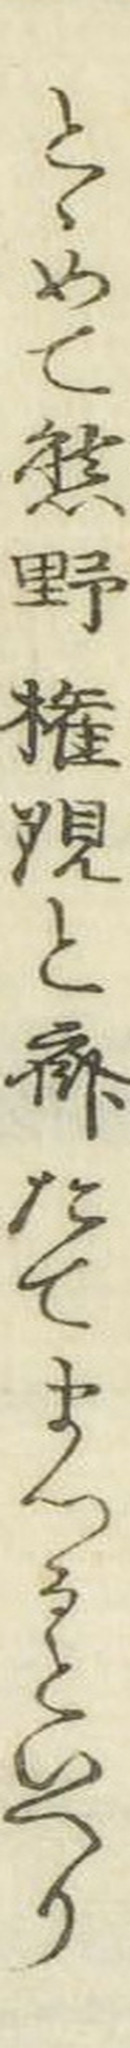とゝめて熊野権現と斎たてまつるといへり
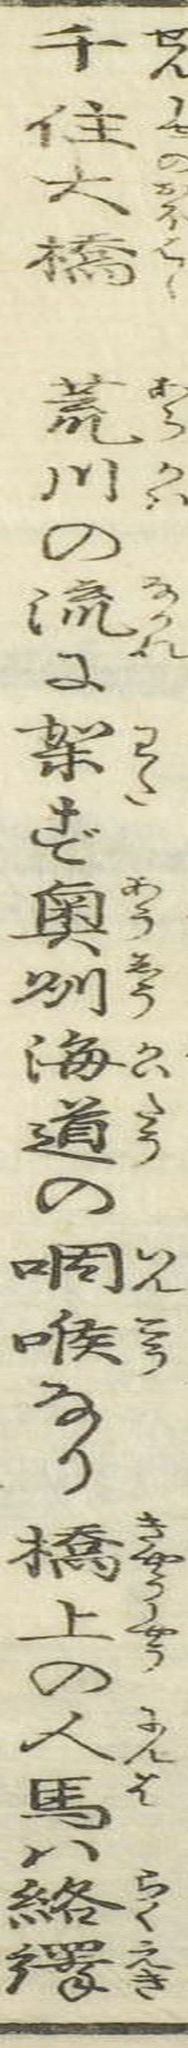千住大橋荒川の流に架す奥州海道の咽喉なり橋上の人馬は絡繹
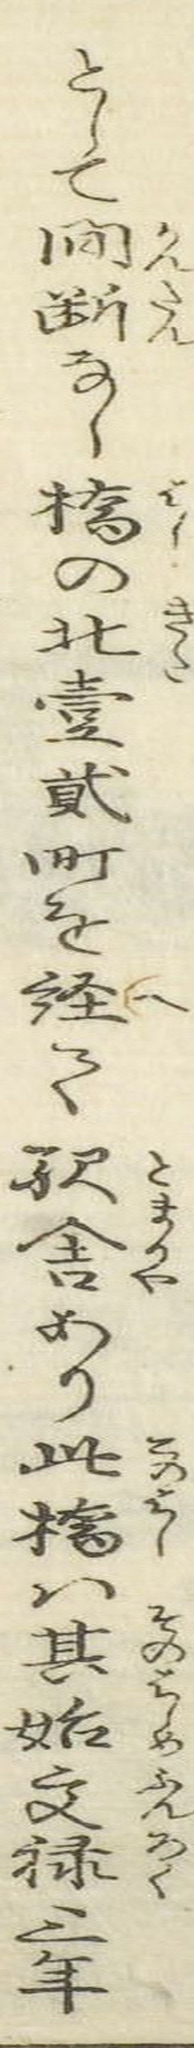として間断なし橋の北壱弐町を経て駅舎あり此橋は其始文禄三年
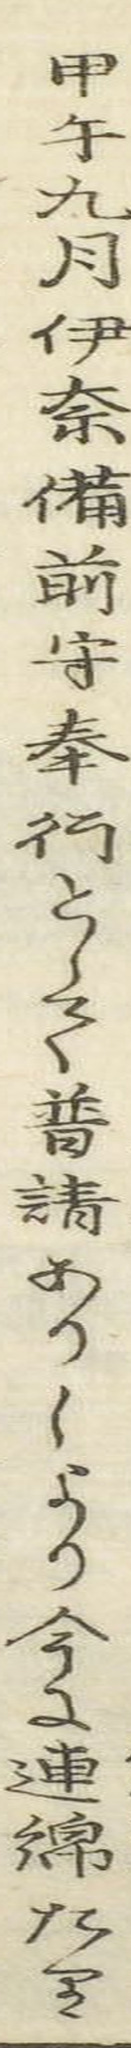甲午九月伊奈備前守奉行として普請ありしより今に連綿たり
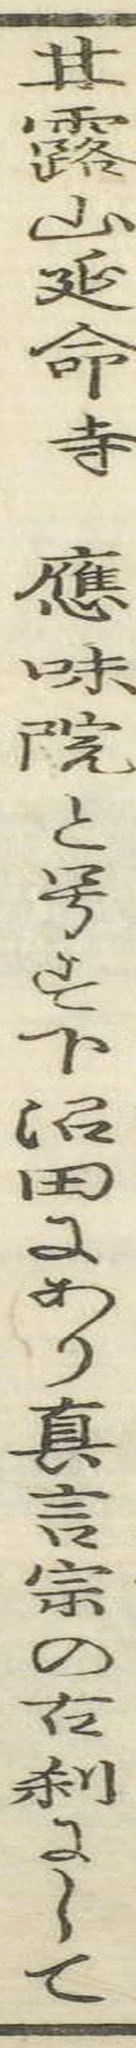甘露山延命寺応味院と号す下沼田にあり真言宗の古刹にして
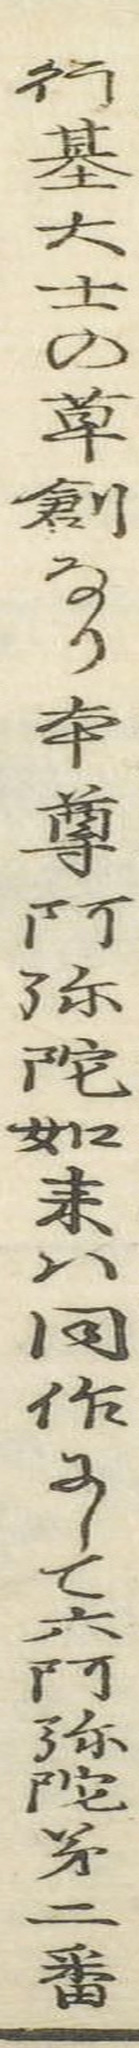行基大士の草創なり本尊阿弥陀如来は同作にして六阿弥陀第二番
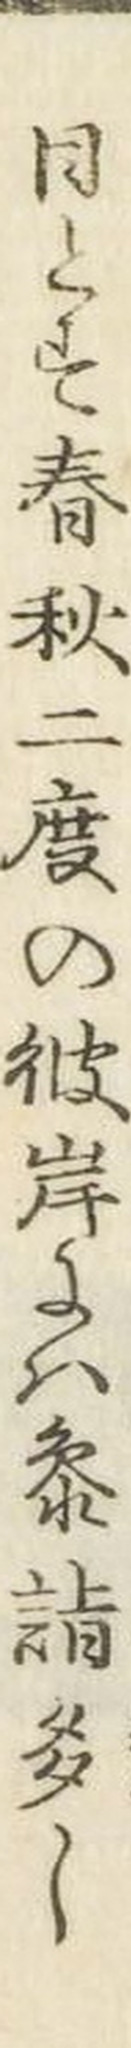目とす春秋二度の彼岸には参詣多し
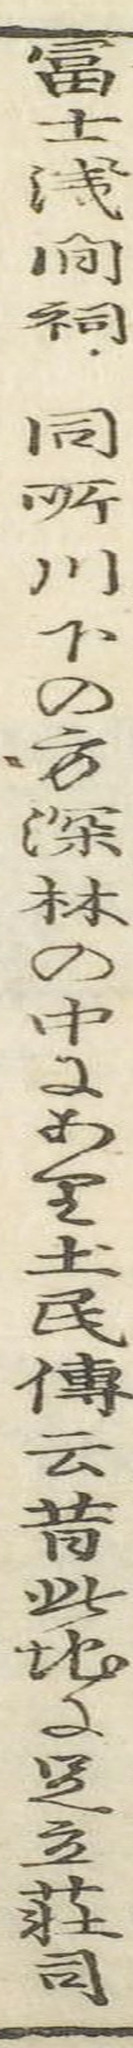富士浅間祠同所川下の方深林の中にあり土民伝云昔此地に足立荘司
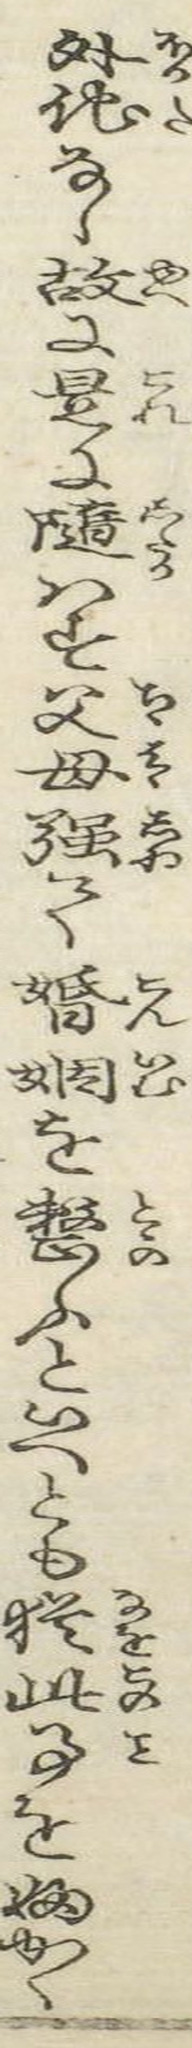外他なし故に是に随はす父母強て婚姻を整ふといへとも猶此事をふかく
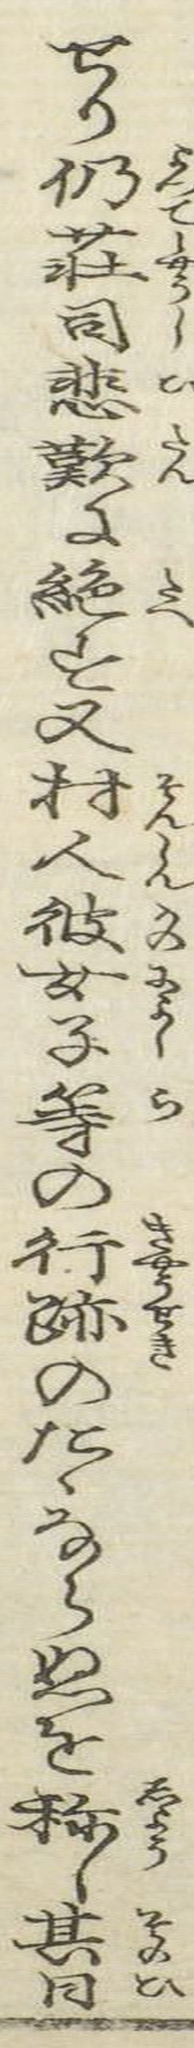せり仍荘司悲歎に絶す又村人彼女子等の行跡のたゝならぬを称し其日
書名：江戸名所図会 20巻 巻之17
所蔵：東京学芸大学教育コンテンツアーカイブ
